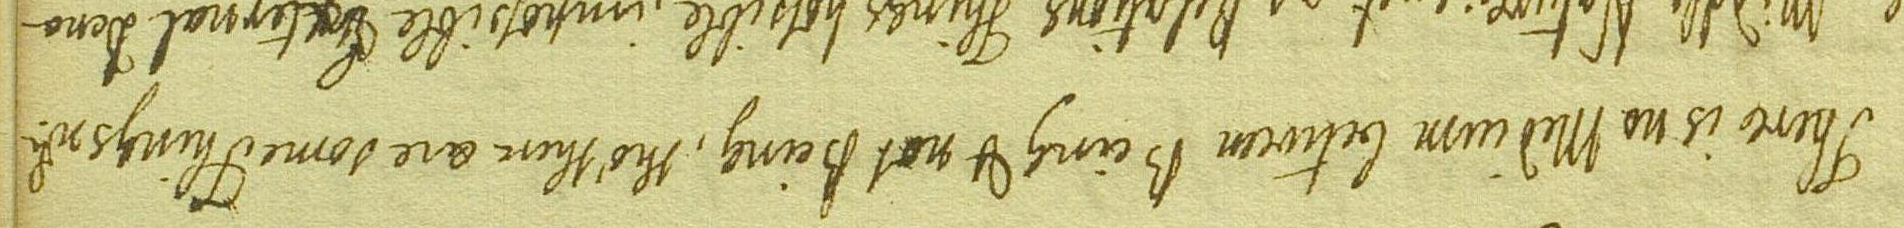There is no Medium between Being & not Being, tho' there are some Things w^h.
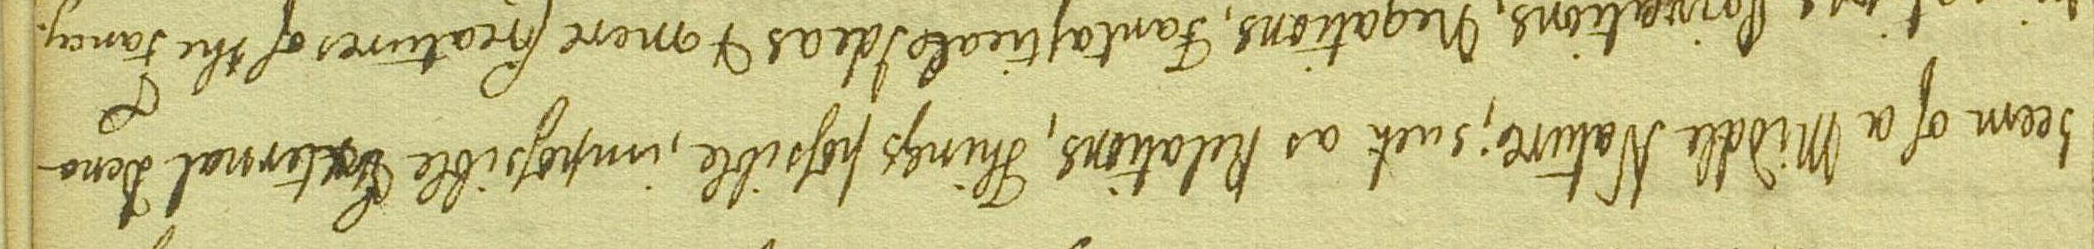seem of a Middle Nature; such as Relations, Things possible, impossible External Deno-
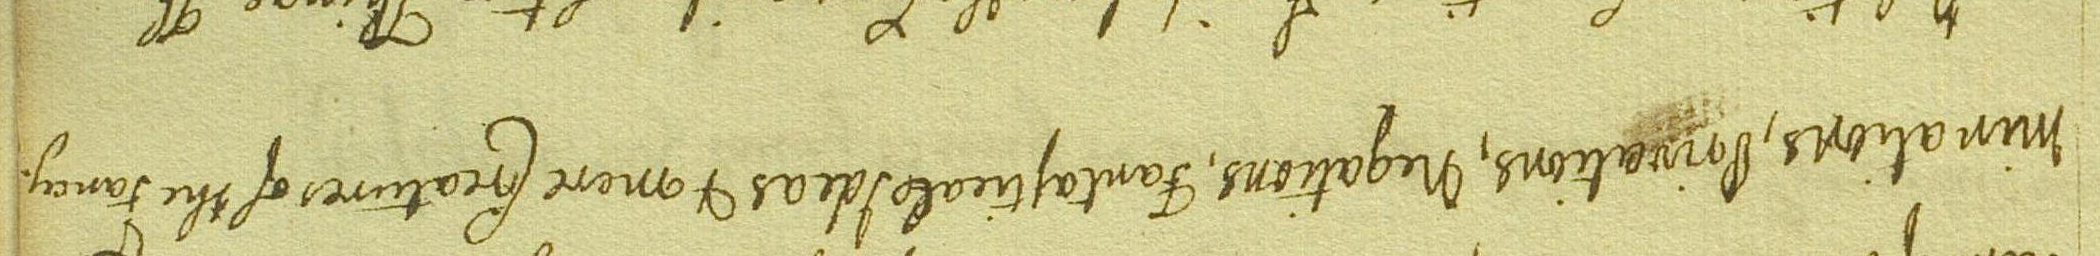minations, Privations, Negations, Fantastical Ideas & mere Creatures of the Fancy.
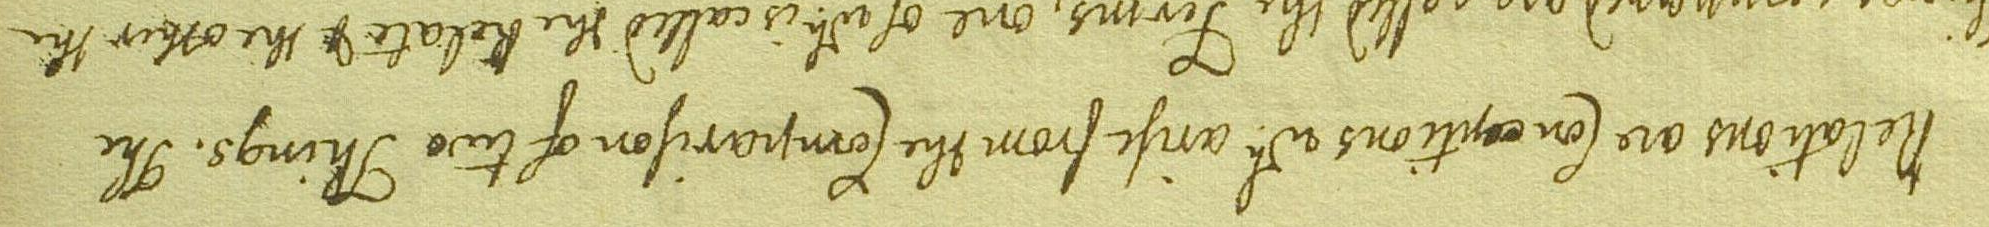Relations are Conceptions w^h. arise from the Comparison of two Things. The
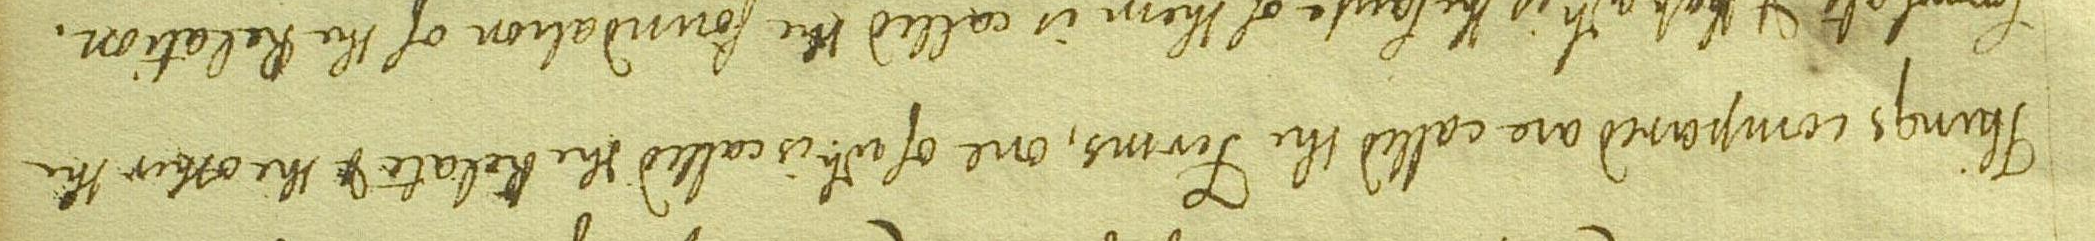things compared are called the Terms, one of w^h. is called the Relate & the other the
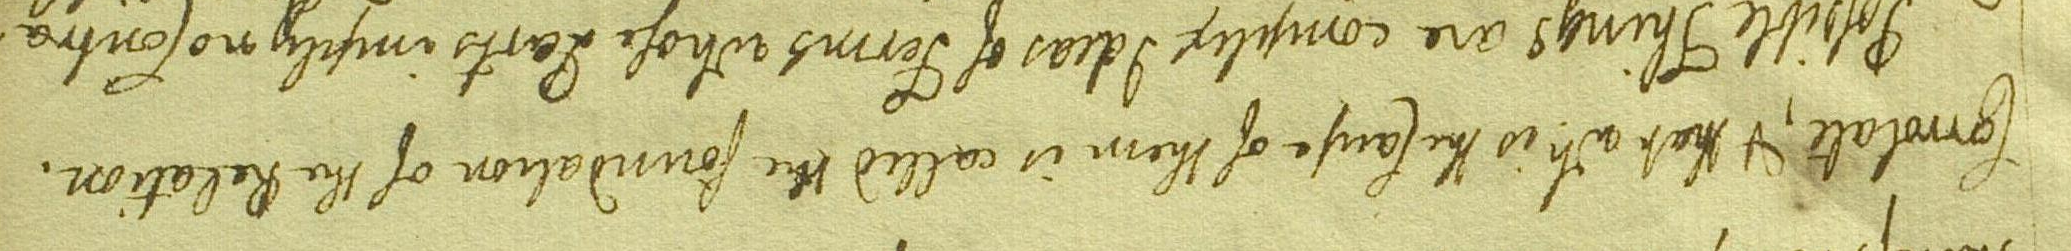Correlate, & that w^h. is the Cause of them is called the foundation of the Relation.
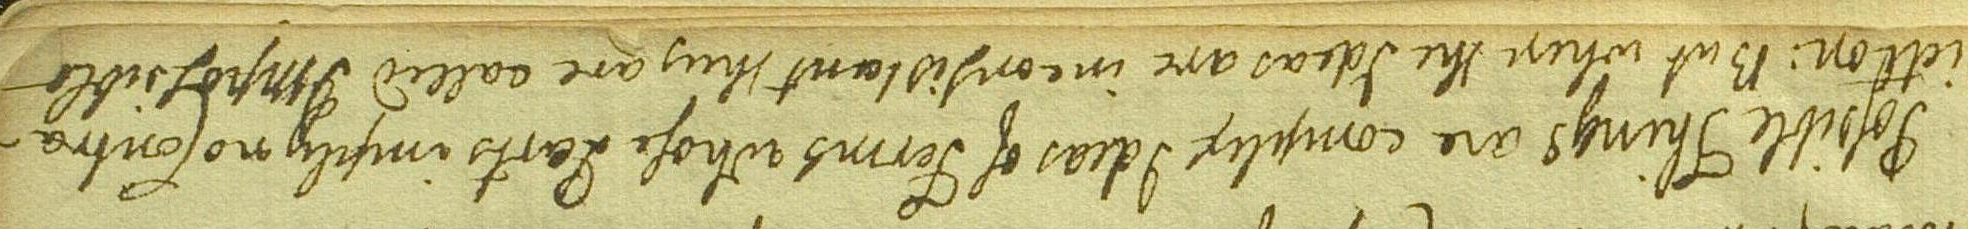Possible Things are complex Ideas of Terms whose Parts imply no Contra-
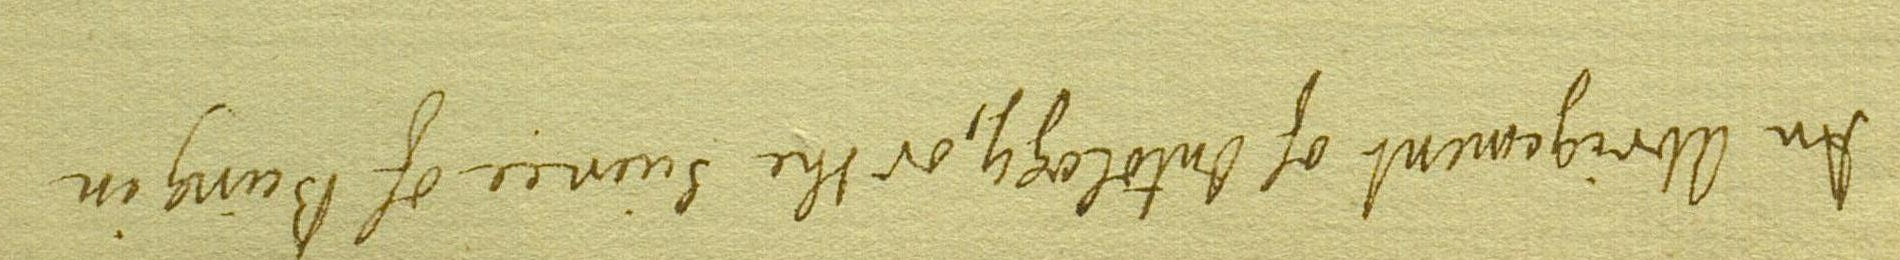An Abrigement of Ontolgy, or the Science of Being in
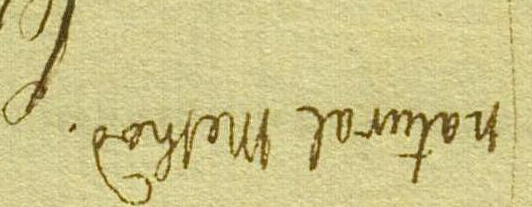natural Method.
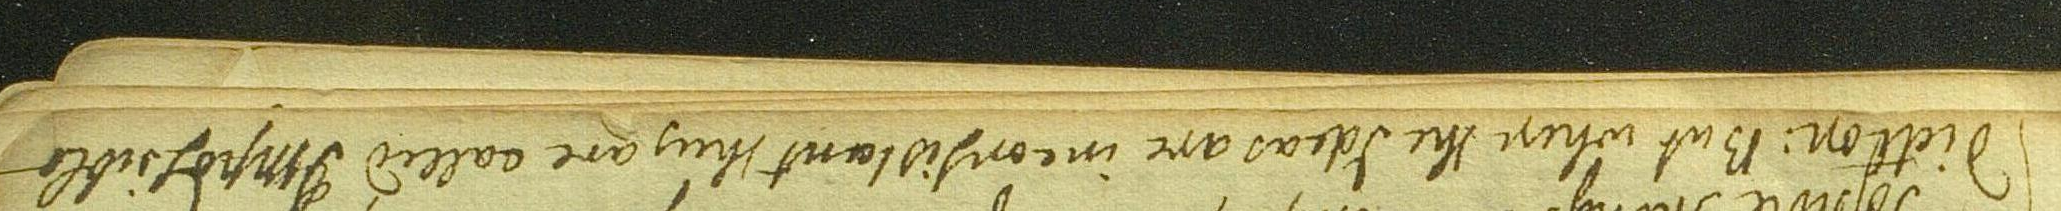diction: But when the Ideas are inconsistant thus are called Impossible
